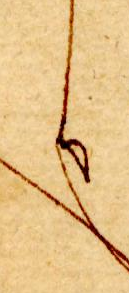To
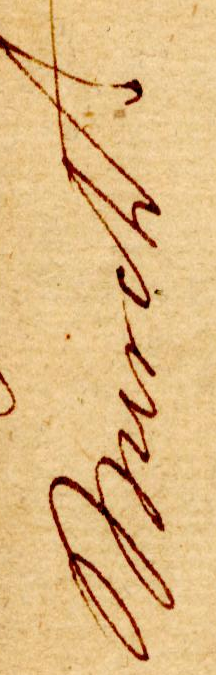Merch^t
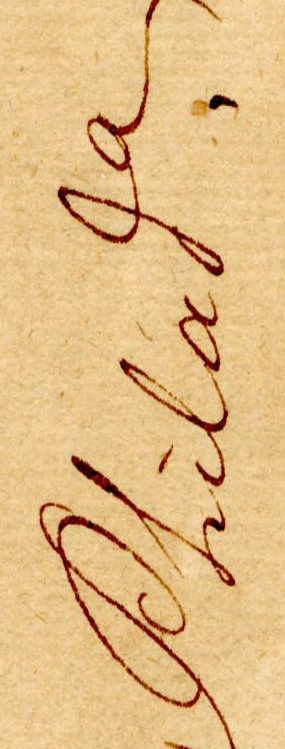Philad^a
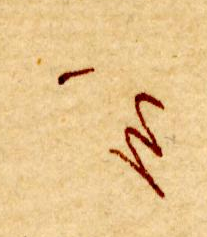in
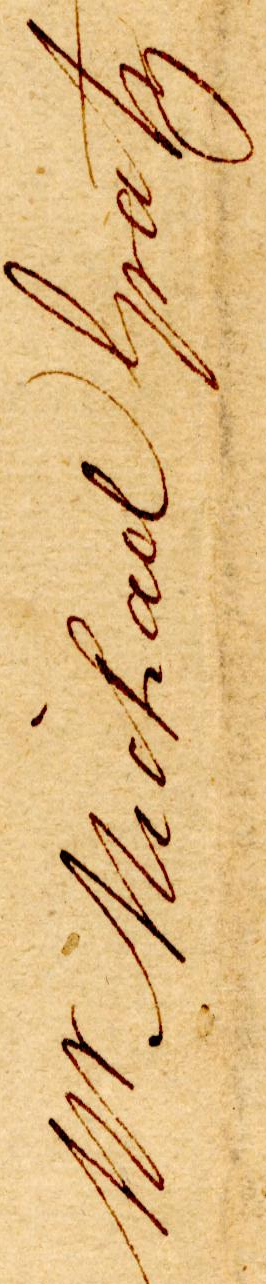M^r Michael Gratz
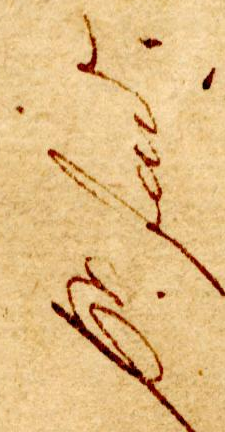Per Fav^r
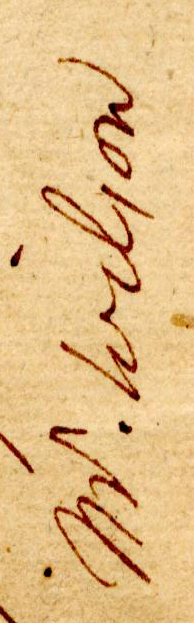M^r Wrilion
